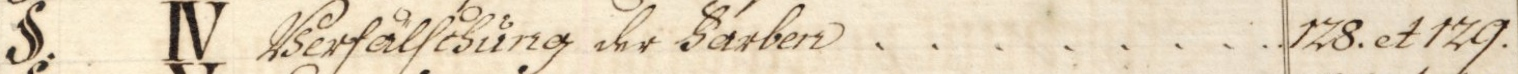§. IV Verfälschung der Farben. 128. et 129.
